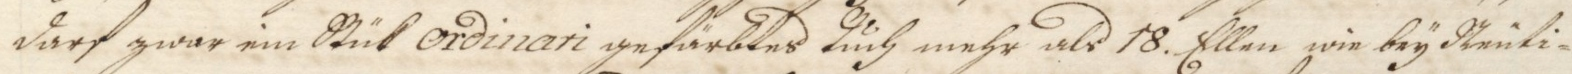darf zwar ein Stük ordinari gefärbtes Tuch mehr als 18. Ellen wie bey Neüti-
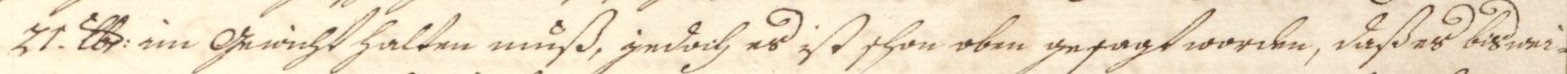21. lb. im Gewicht halten muß, jedoch es ist schon oben gesagt worden, daß es biswei-
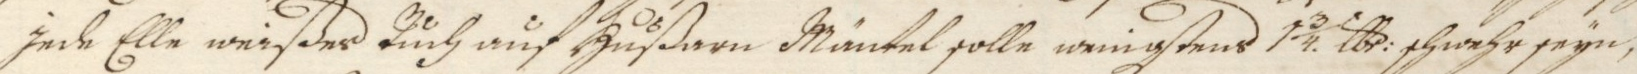Jede Elle weißes Tuch auf Hußarn Mäntel solle wenigstens 1 3/4 lb. schwehr seyn,
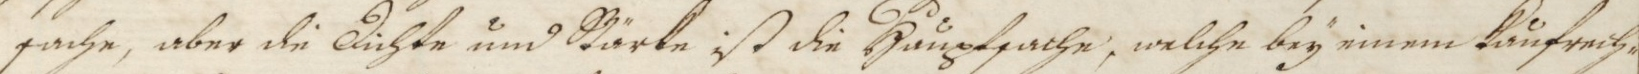sache, aber die Dichte und Stärke ist die Hauptsache, welche bey einem Kaufrech-
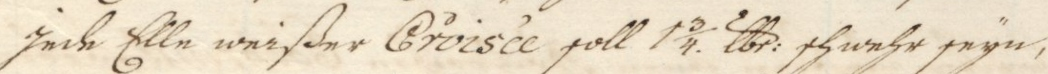Jede Elle weißer Croisée soll 1 3/4 lb. schwehr seyn,
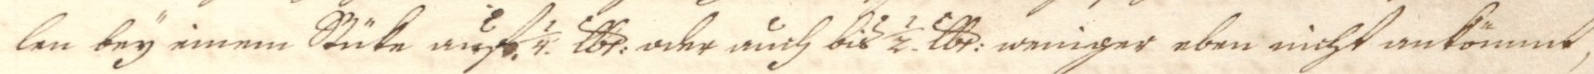len bey einem Stüke auf 1/4. lb. oder auch bis 1/2. lb. weniger eben nicht ankömmt,
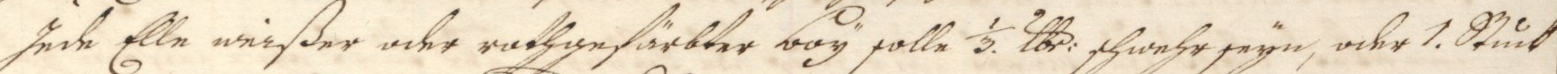Jede Elle weißer oder rothgefärbter Boy solle 1/3. lb. schwehr seyn, oder 1. Stuck
